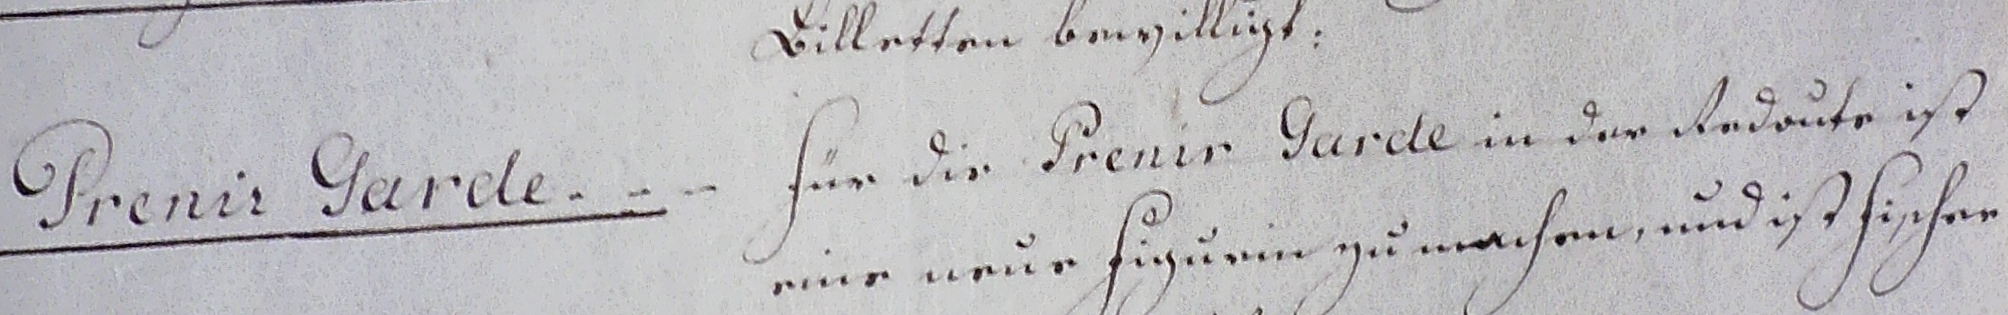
Prenir Garde. .. .. Für die Prenir Garde in der Redoute ist
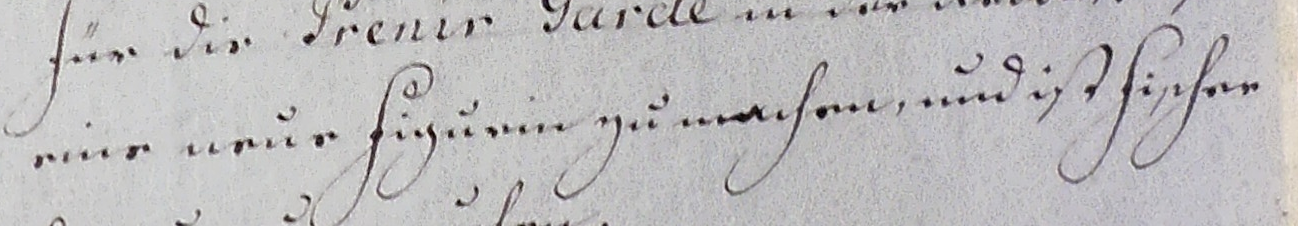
eine neue Figurin zu machen und ist Fischer
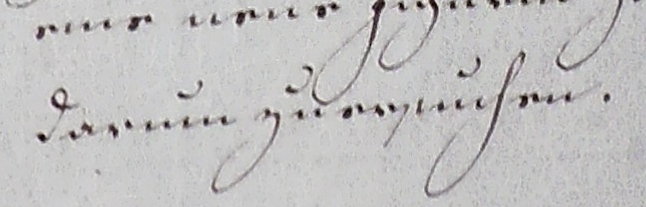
darum zu ersuchen.
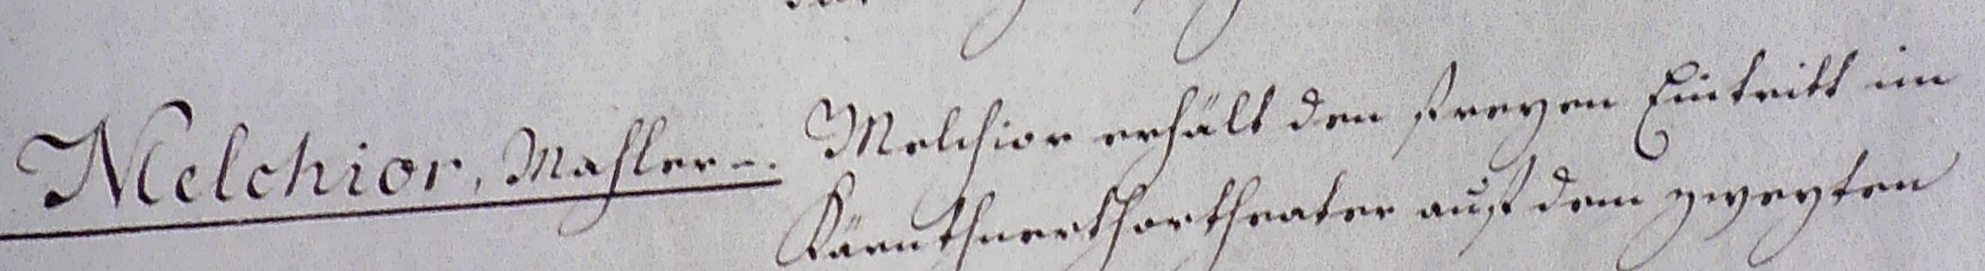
Melchior, Mahler .. Melchior erhält den freyen Eintritt im
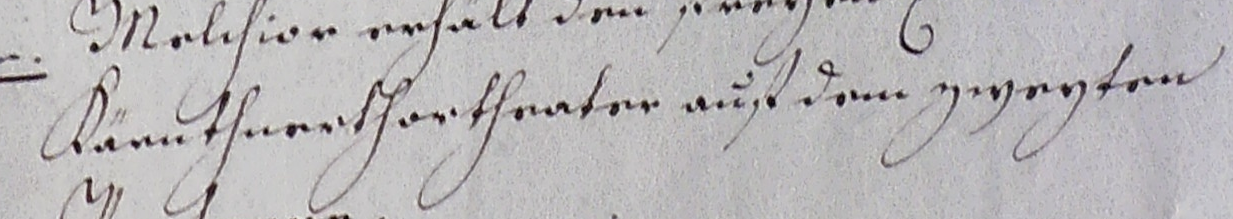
Kärnthnerthortheater auf dem zweyten
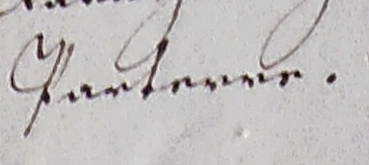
Parterre.
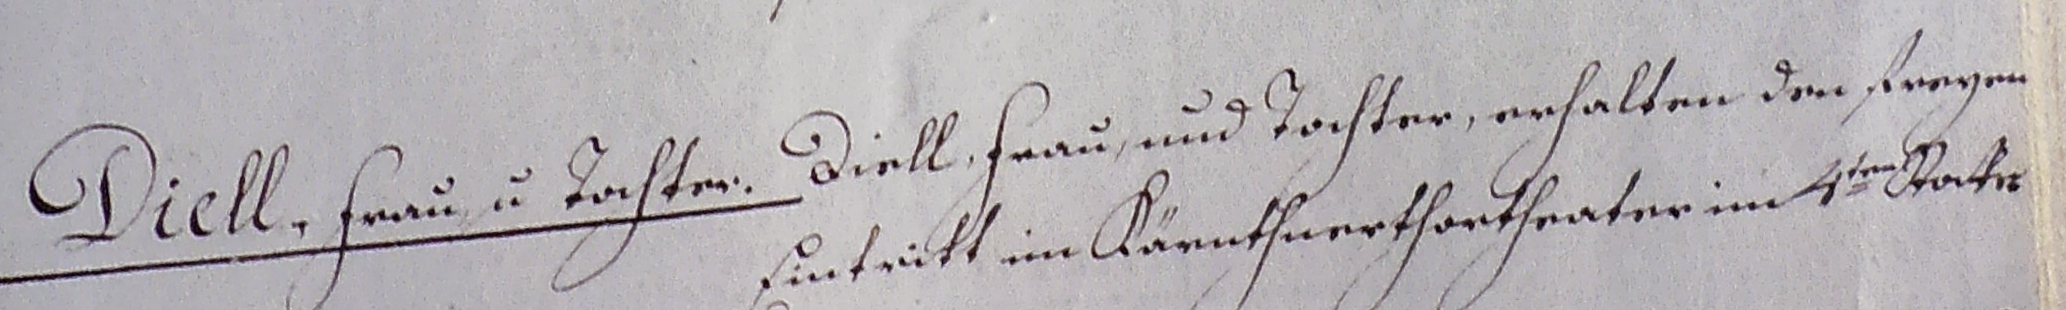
Diell, Frau u Tochter: Diell Frau und Tochter, erhalten den freyen
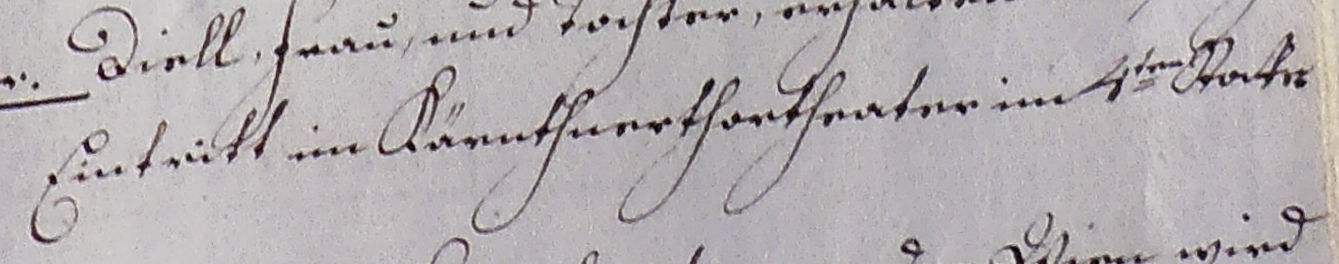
Eintritt im Kärnthnerthortheater im 4te͇n Stocke.
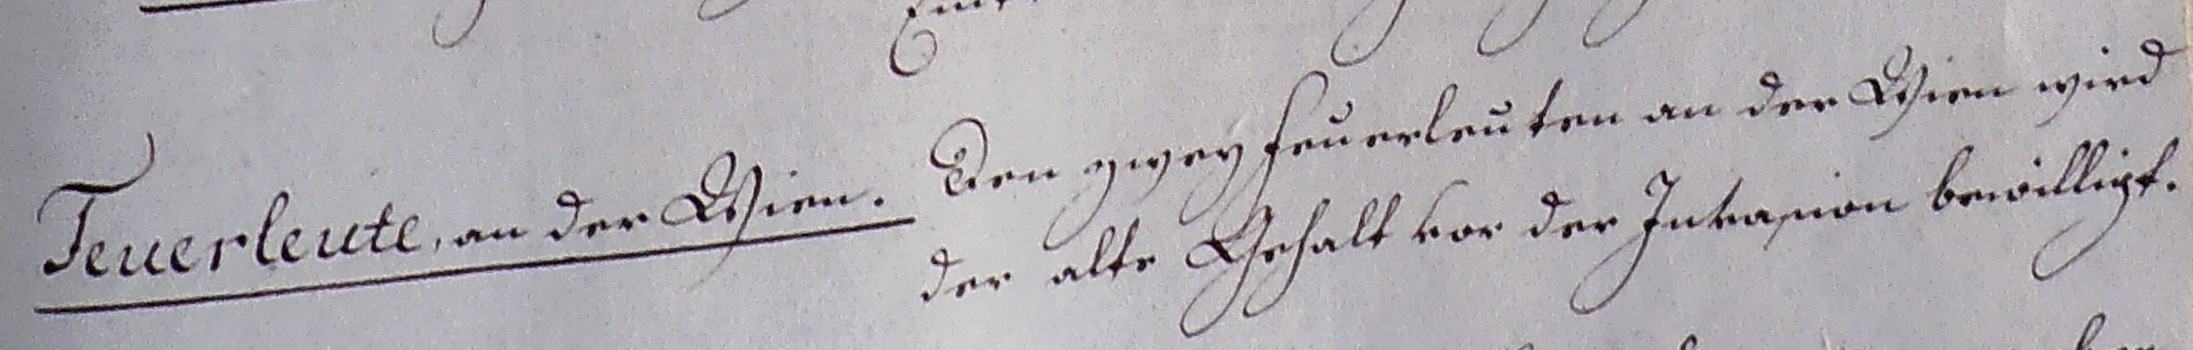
Feuerleute, an der Wien. Den zwey Feuerleuten an der Wien wird
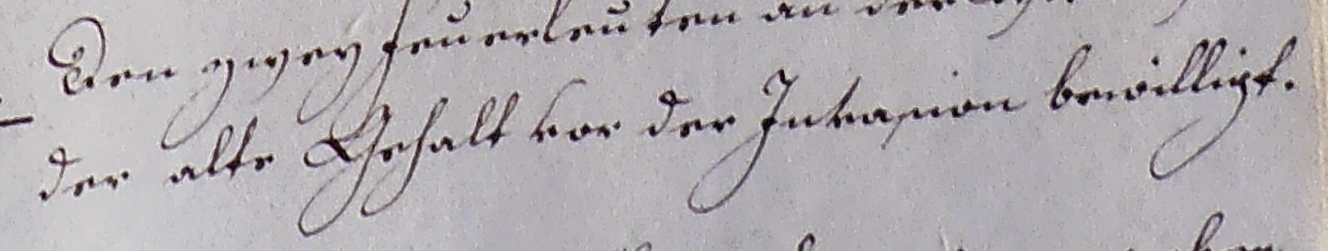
der alte Gehalt vor der Invasion bewilligt.
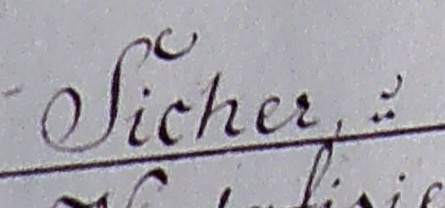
Sicher, u
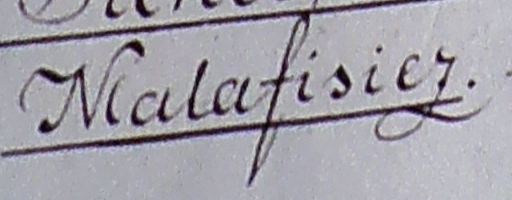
Malafisiez.
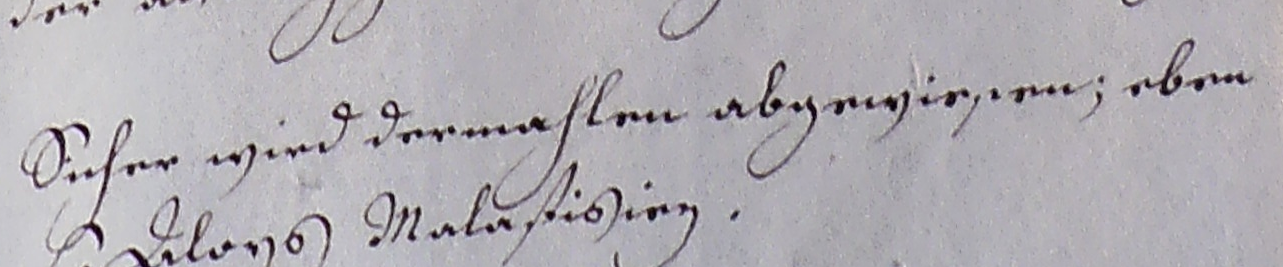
Sicher wird dermahlen abgewiesen; eben
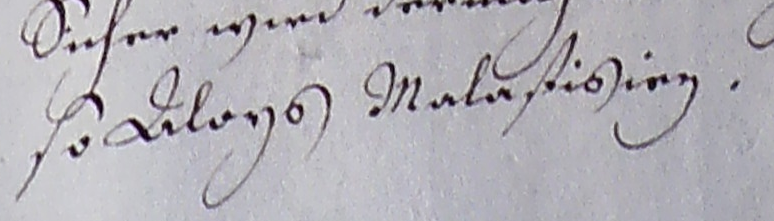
so Aloys, Malafisiez.
